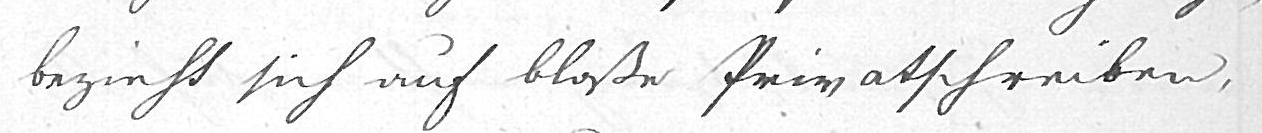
bezieht sich auß bloße Privatschreiben,
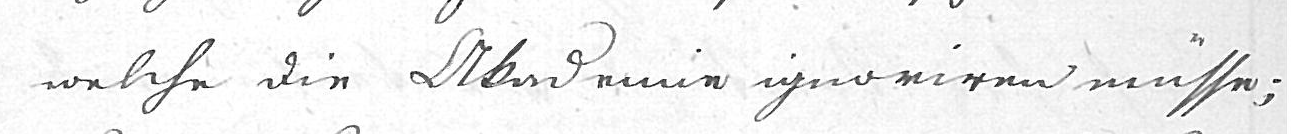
welche die Akademie ignoriren müsse;
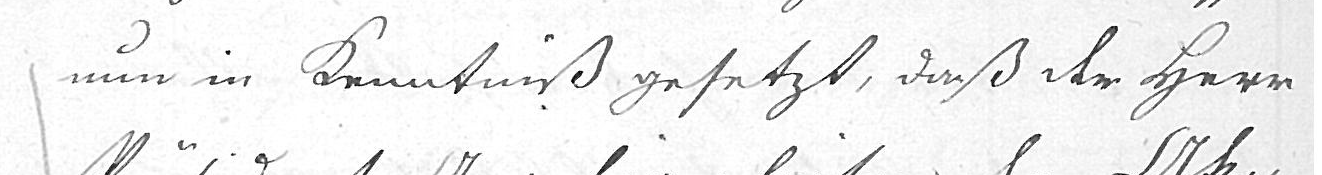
nun in Kenntniß gesetzt, daß der Herr
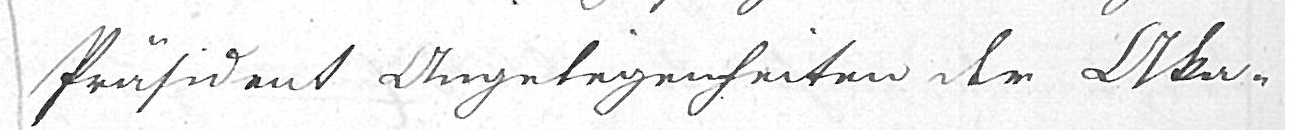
Präsident Angelegenheiten der Aka-
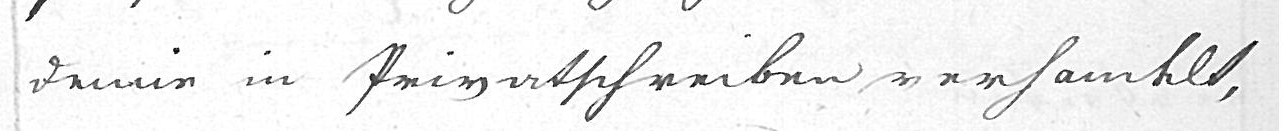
demie in Privatschreiben verhandelt,
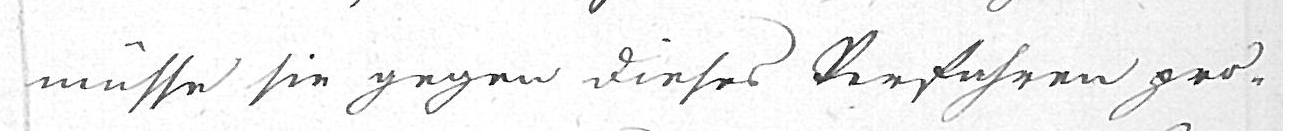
müsse sie gegen dieses Verfahren pro-
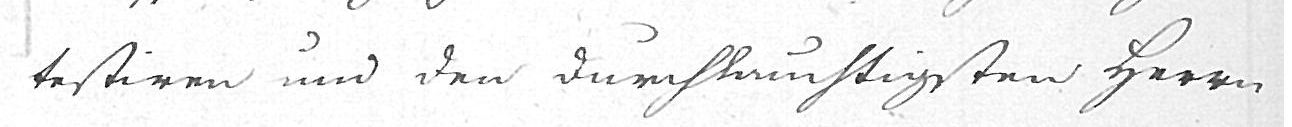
testiren und den durchlauchtigsten Herrn
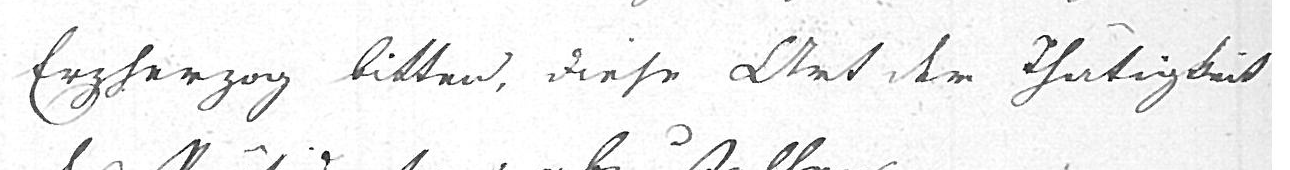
Erzherzog bitten, diese Art der Thätigkeit
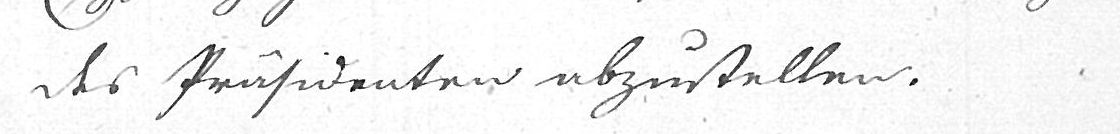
des Präsidenten abzustellen.
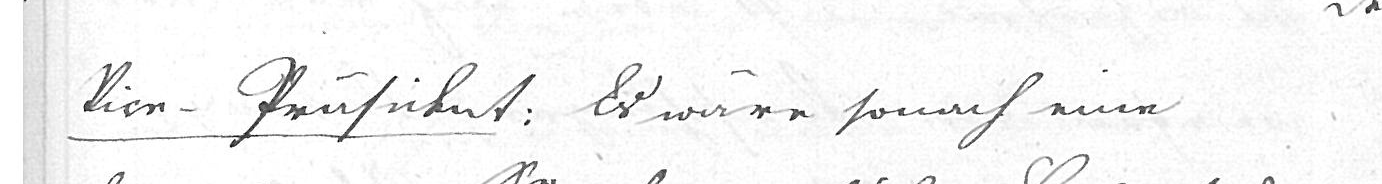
Vice-Präsident: Es wäre sonach eine
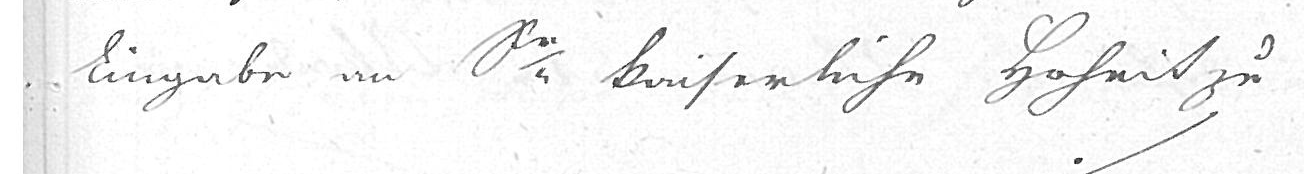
Eingabe an Sr. kaiserliche Hoheit zu
